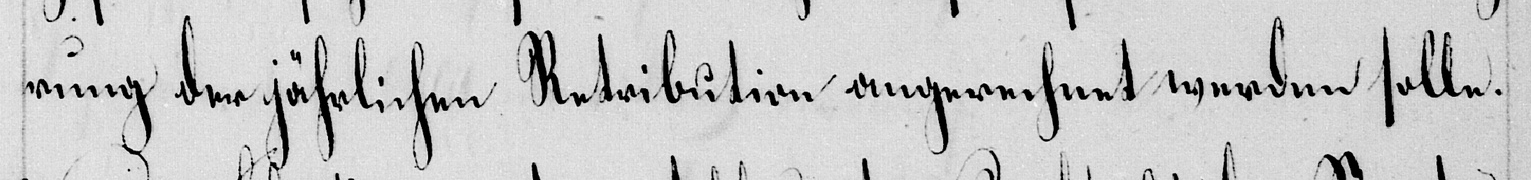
rung der jährlichen Retribution angerechnet werden solle.
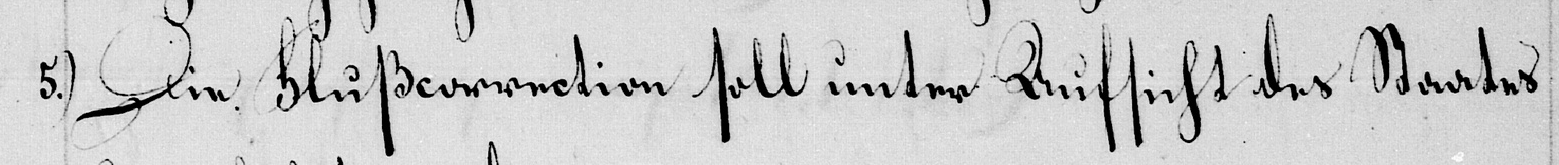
5.) Die Flußcorrection soll unter Aufsicht des Staates
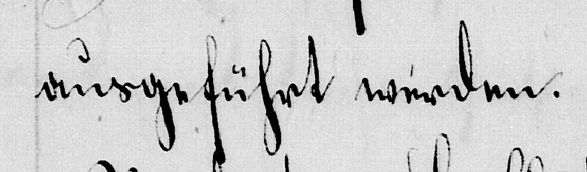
ausgeführt werden.
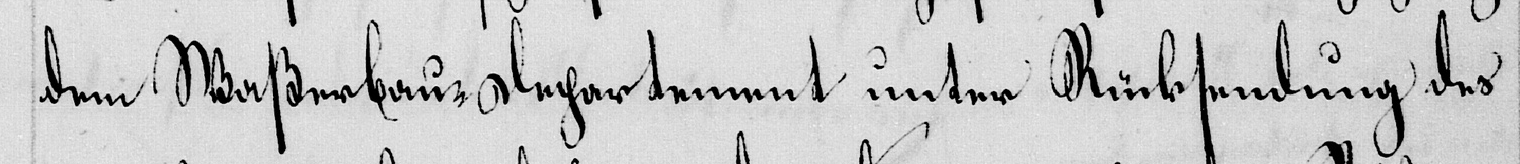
dem Waßerbau-Departement unter Rücksendung des
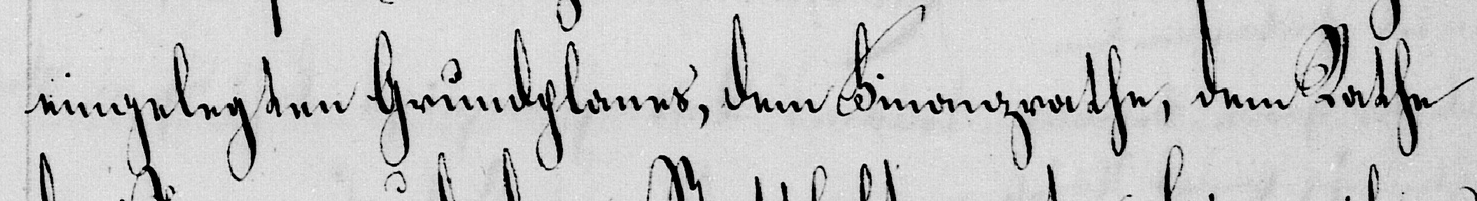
eingelegten Grundplanes, dem Finanzrathe, dem Rathe
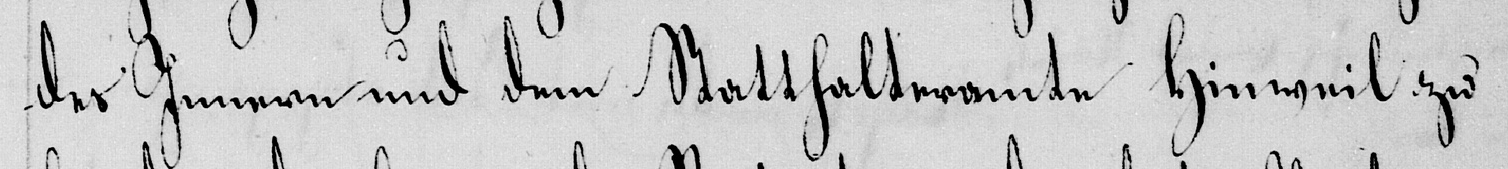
des Innern und dem Statthalteramte Hinweil zu
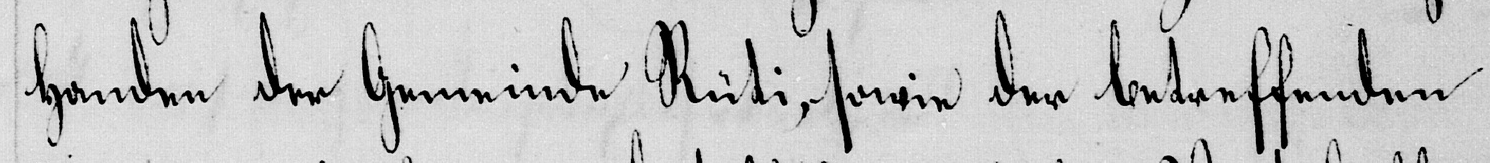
Handen der Gemeinde Rüti, sowie der betreffenden
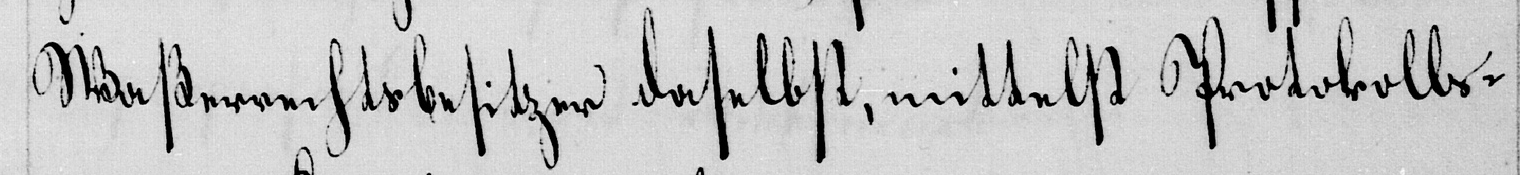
Waßerrechtsbesitzer daselbst, mittelst Protokolls¬
